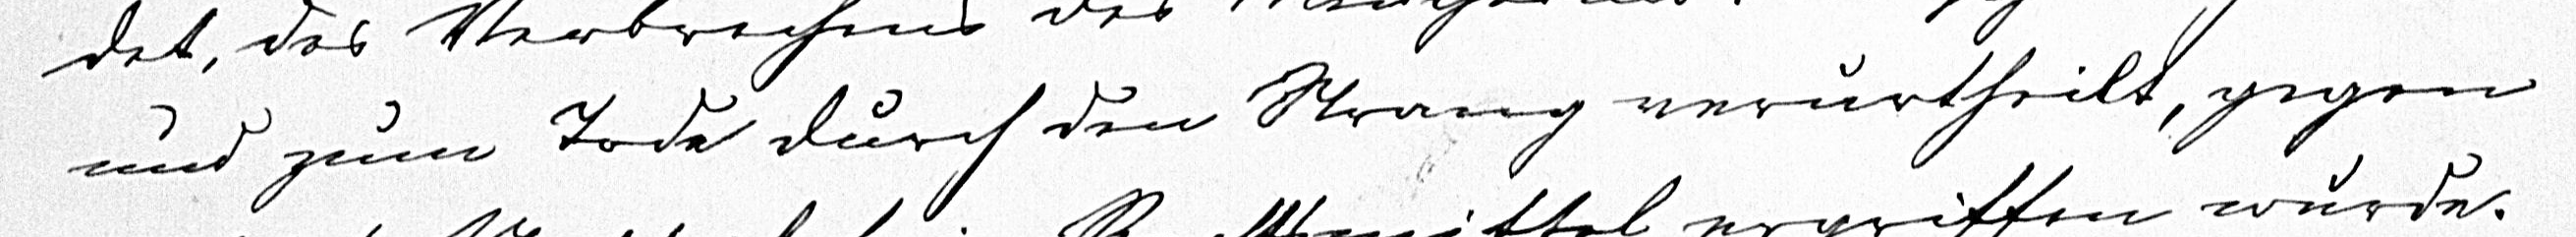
und zum Tode durch den Strang verurtheilt, gegen
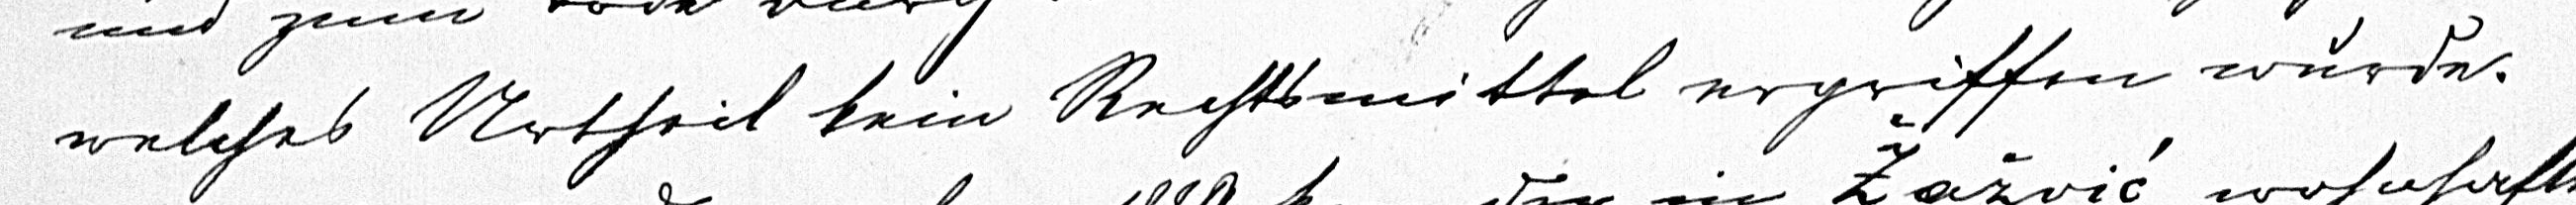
welches Urtheil kein Rechtsmittel ergriffen wurde.
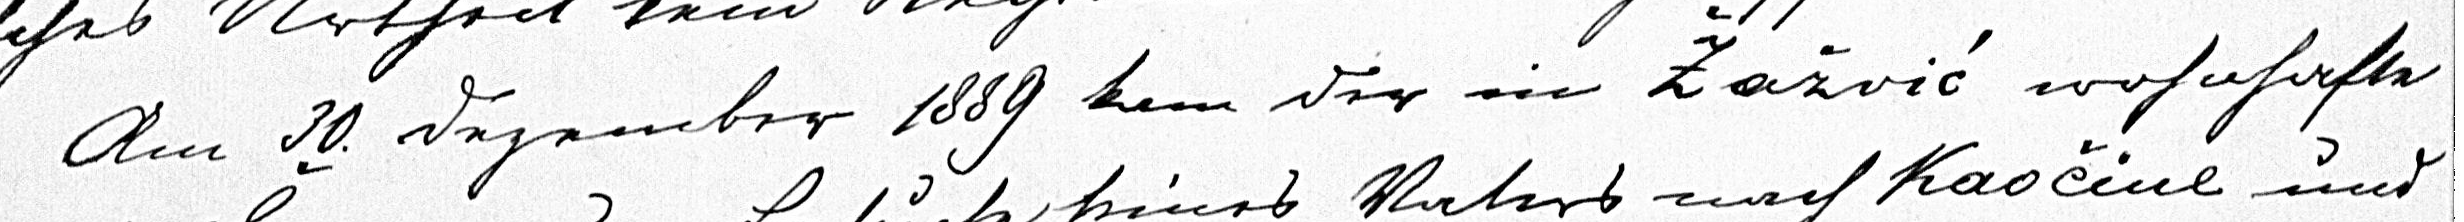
Am 30. Dezember 1889 kein der in Žažvić wohnhafte
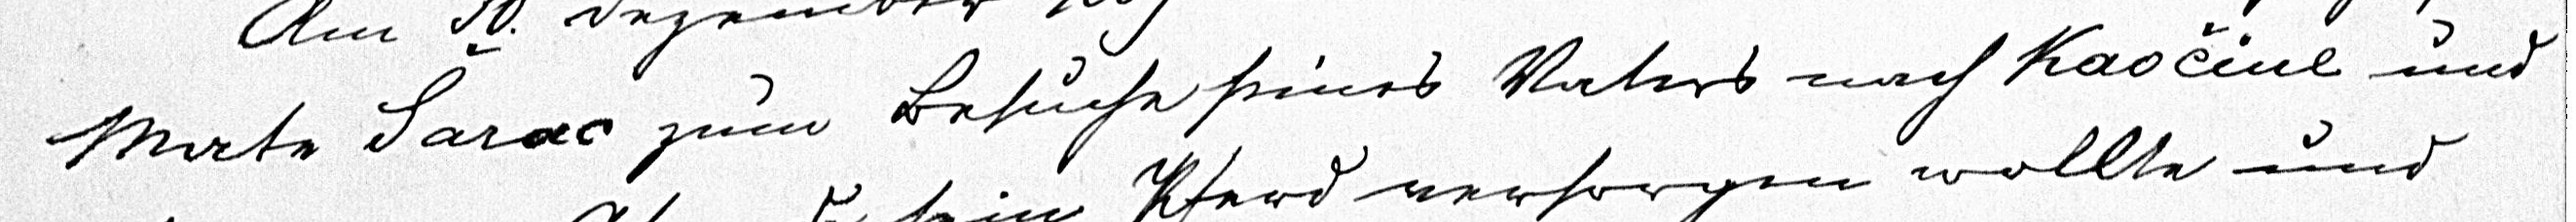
Mate Šarac zum Besuche seines Vaters nach Kaočine und
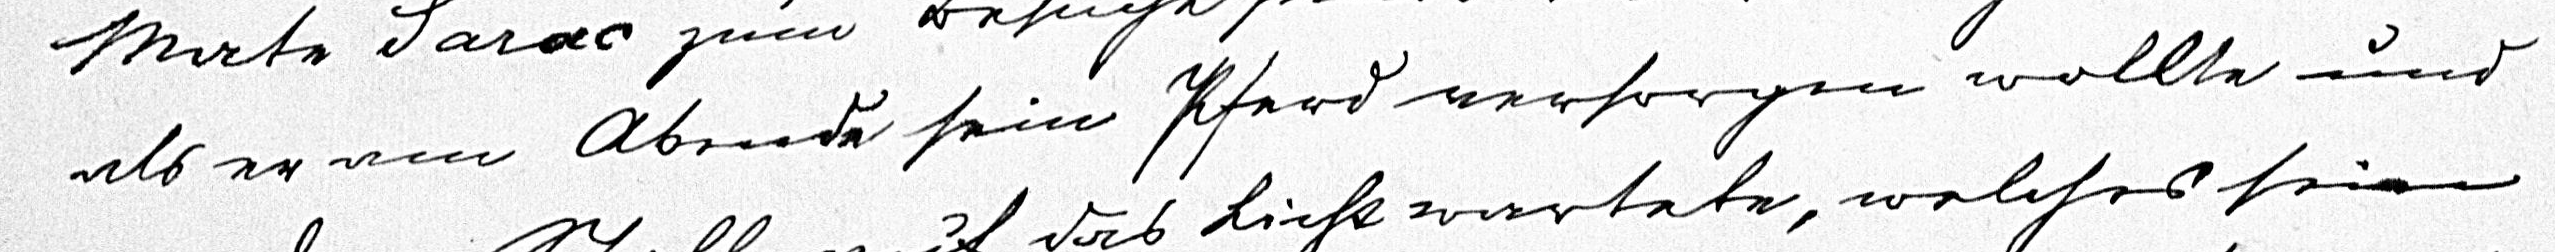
als er am Abende sein Pferd versorgen wollte und
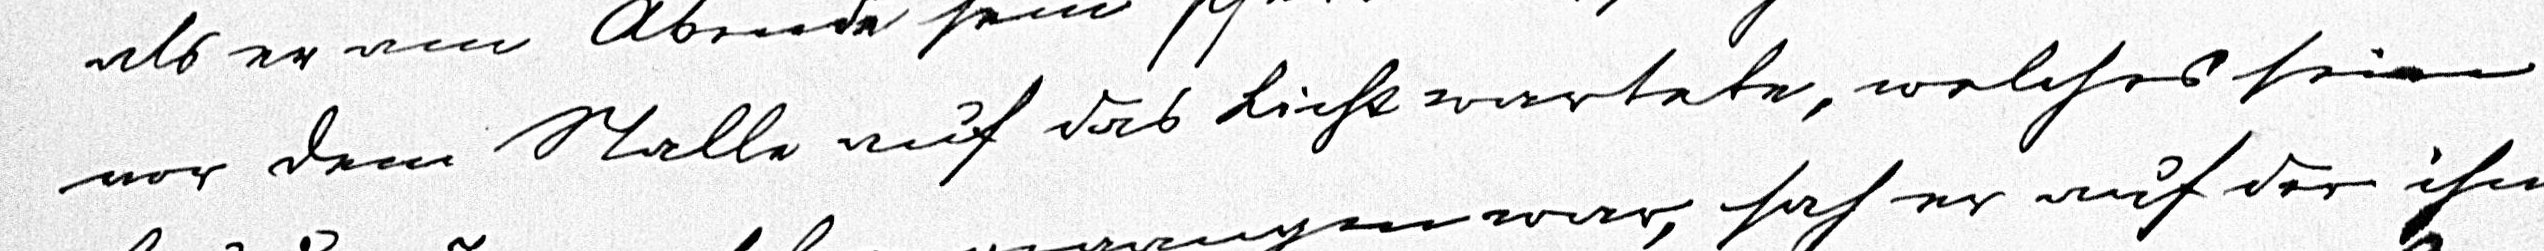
vor dem Stalle auf das Licht wartete, welches sein
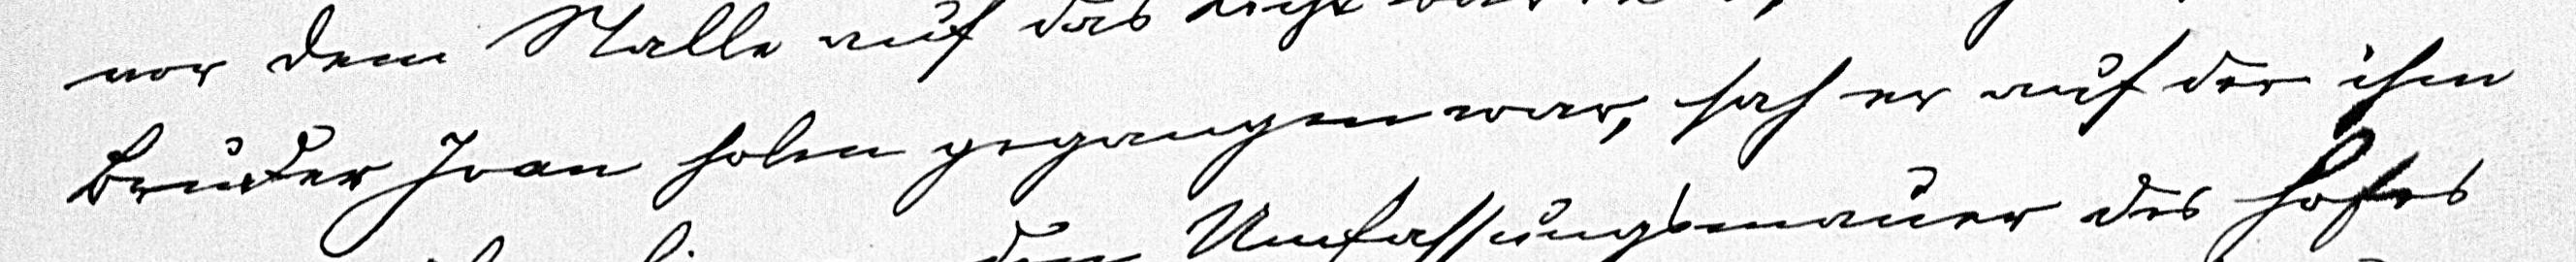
Bruder Ivan holen gegangen war, sah er auf der ihm
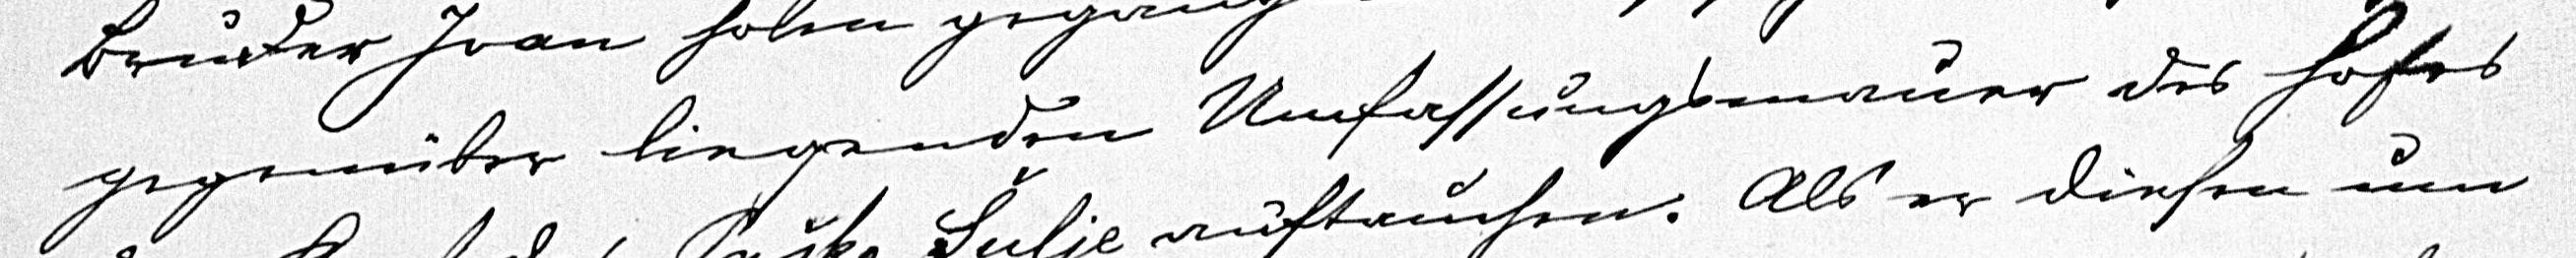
gegenüber liegenden Umfassungsmauer des Hofes
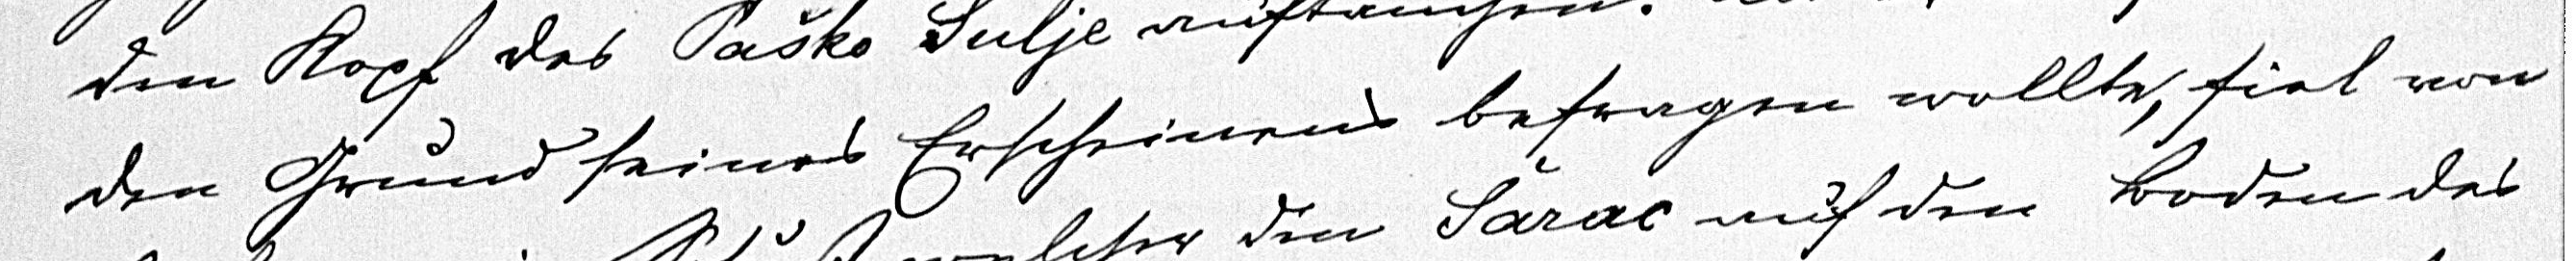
den Kopf des Paško Šulje auftauchen. Als er diesen um
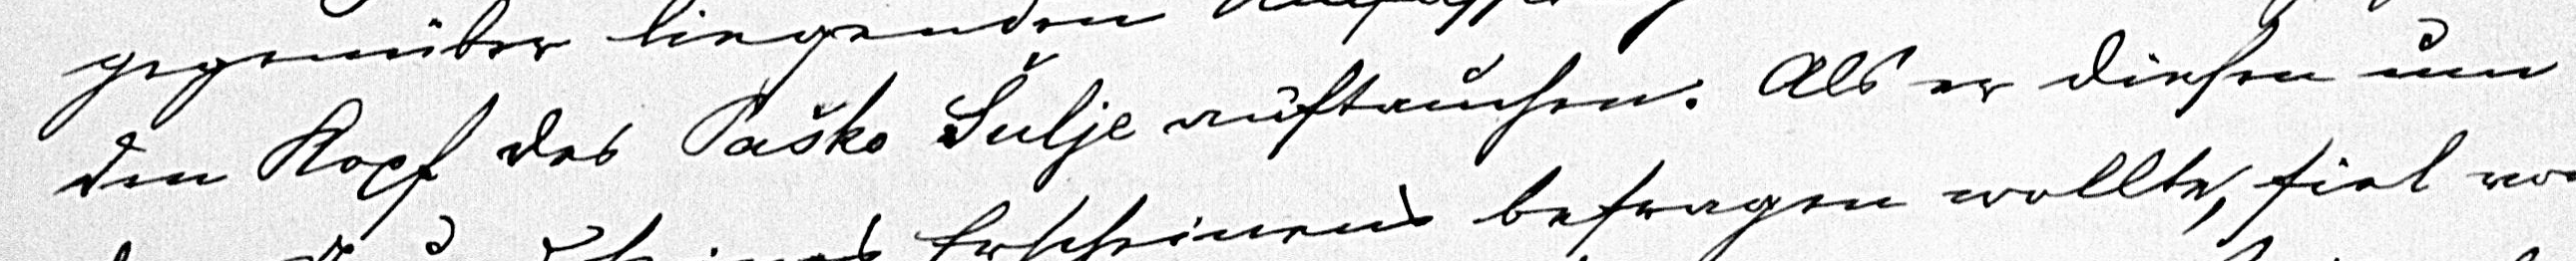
den Grund seines Erscheinens befragen wollte, fiel von
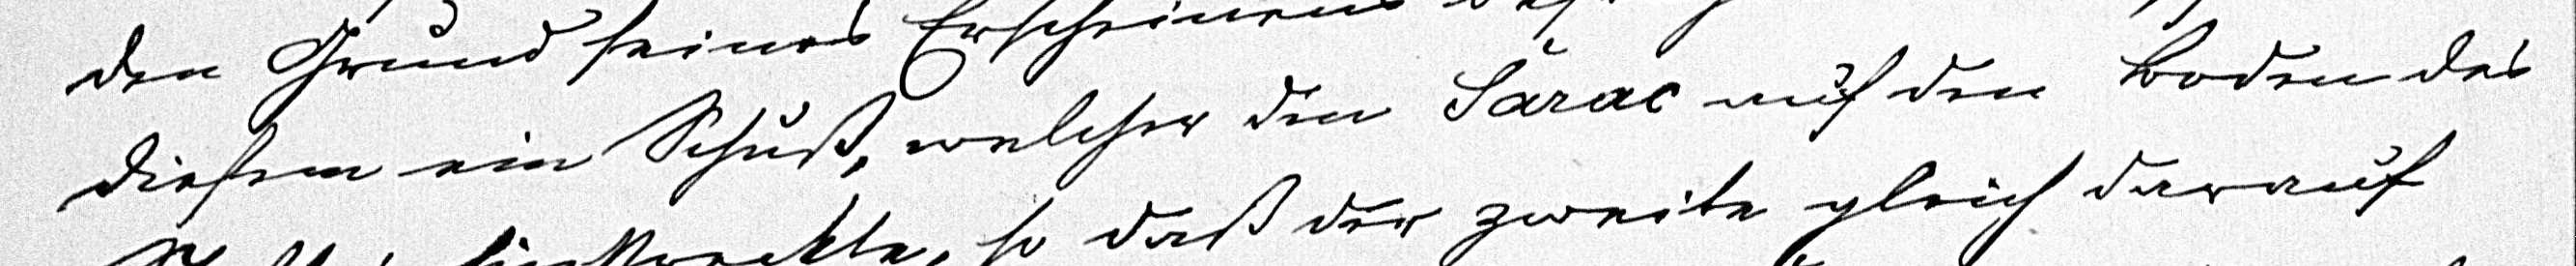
diesem ein Schuß, welcher den Šarac auf den Boden des
